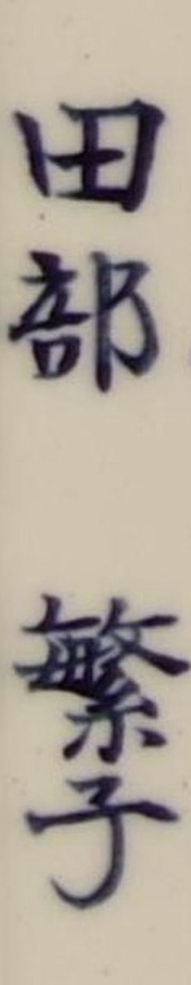田部繁子

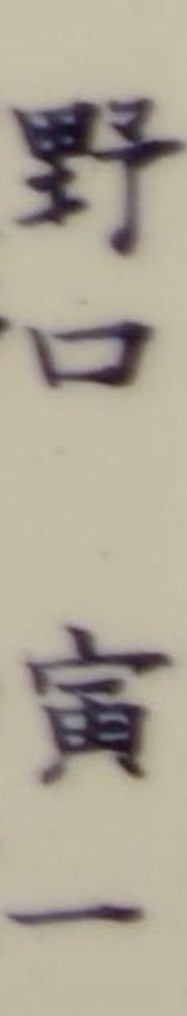野口寅一
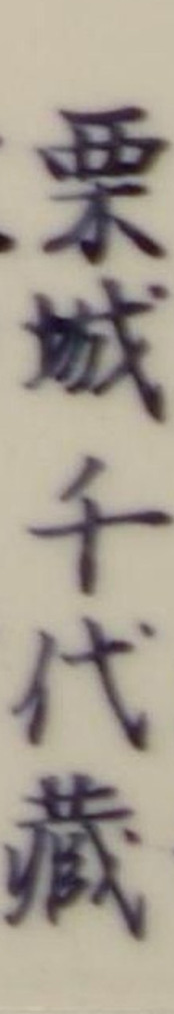栗城千代蔵
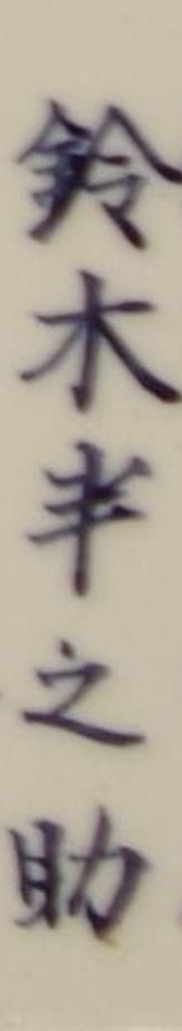鈴木半之助
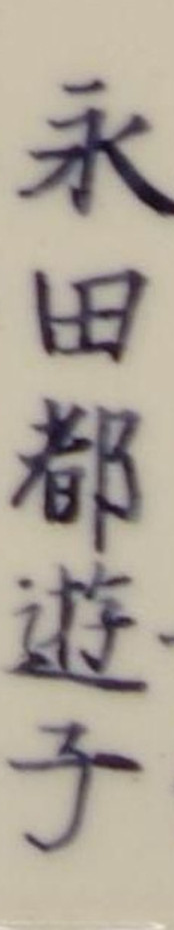永田都遊子
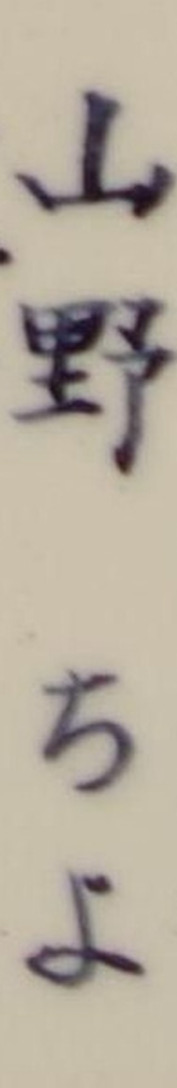山野ちよ
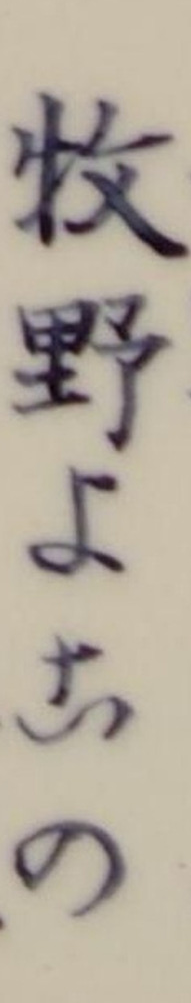牧野よこの
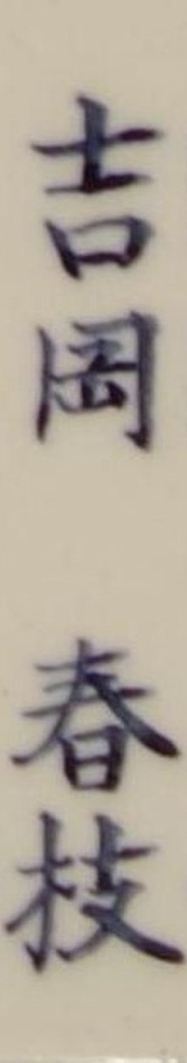吉岡春枝
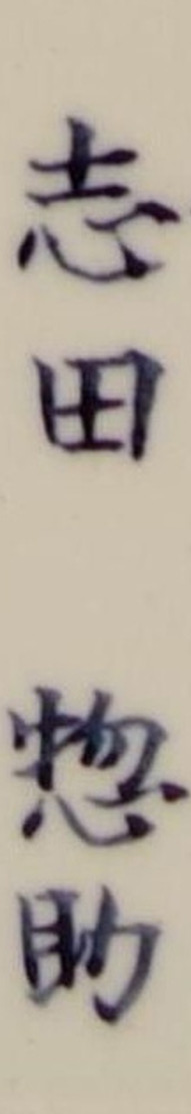志田惣助
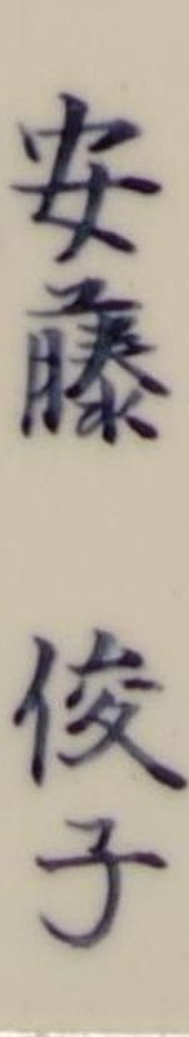安藤俊子
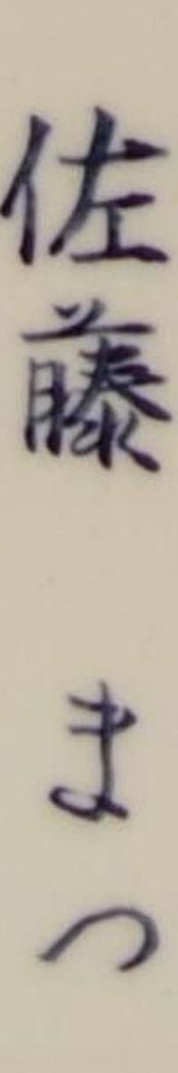佐藤まつ
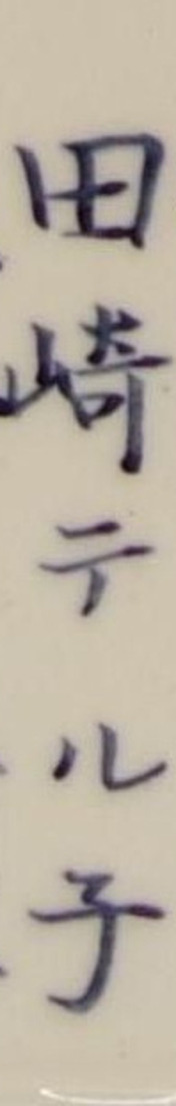田崎テル子
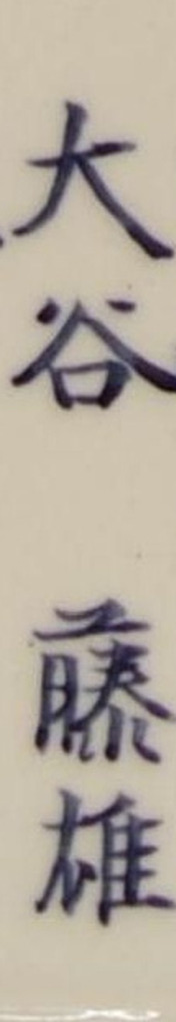大谷藤雄
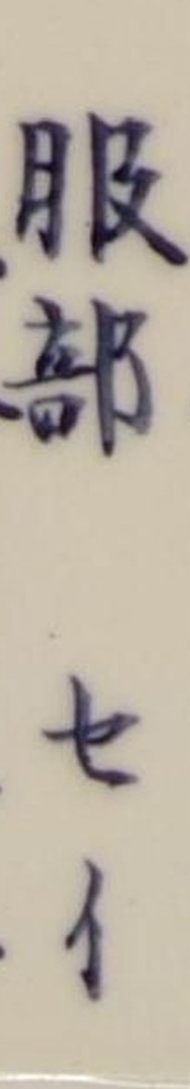服部セイ
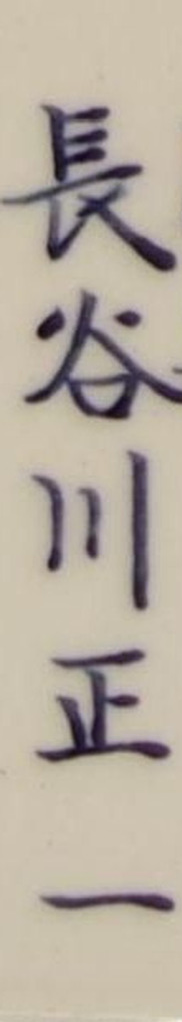長谷川正一
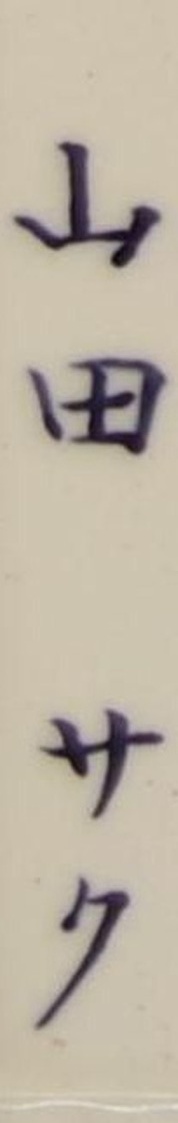山田サク
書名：M~S
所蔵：高野山金剛峯寺
